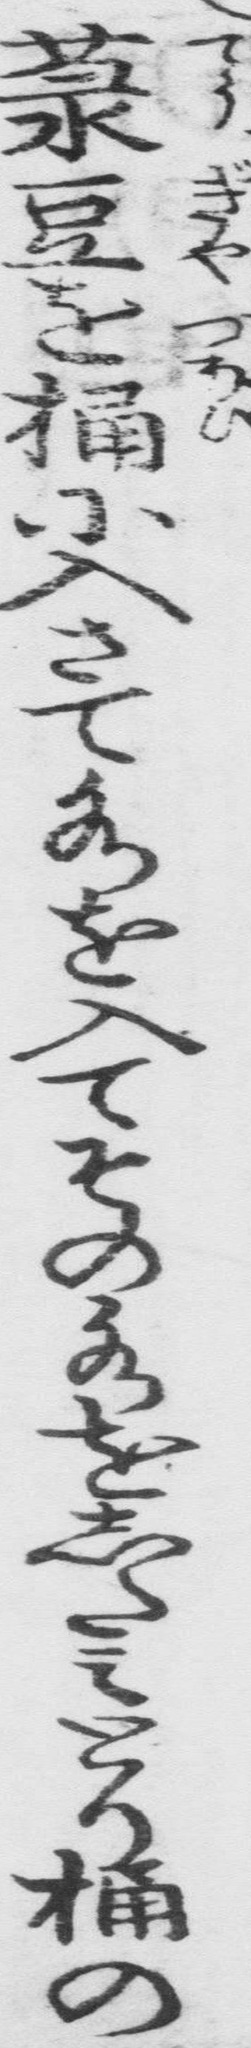菉豆を桶荷尓入さて水を入てその水を志たみとり桶の
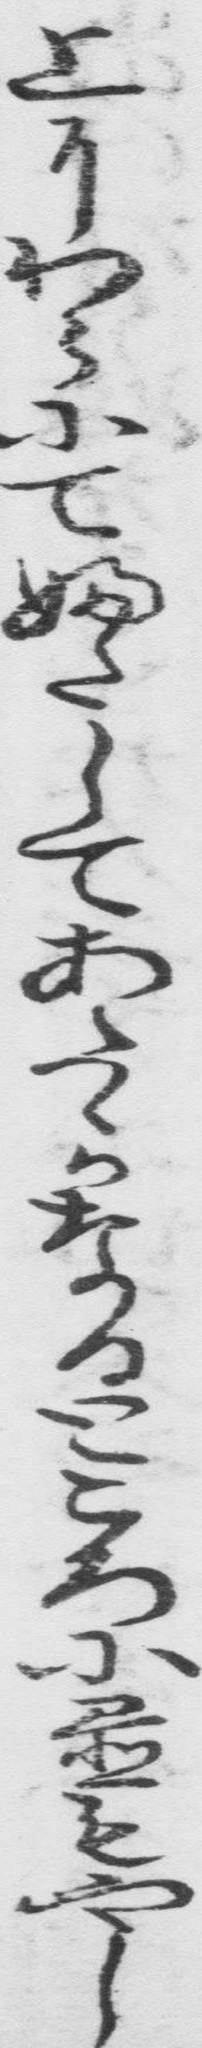上耳わら尓て婦たしてあたゝかなるところ尓置もやし
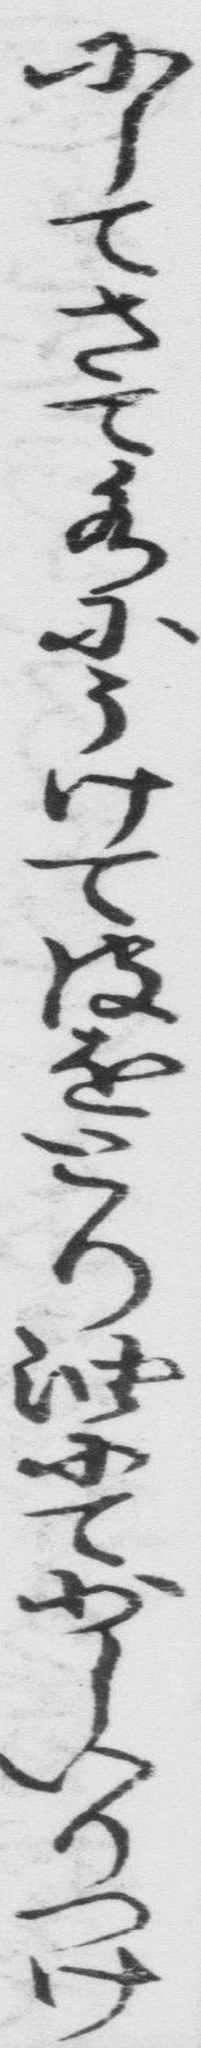尓してさて水尓うけて皮をとり油尓て少しいりつけ
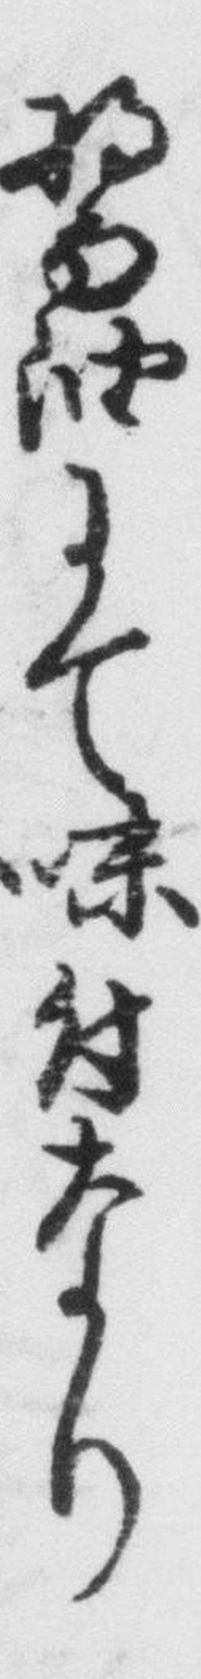醤油尓て味付なり
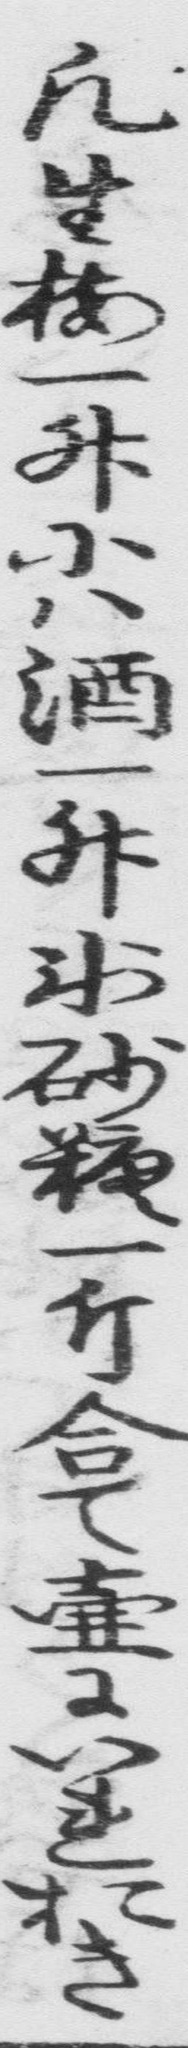凡生梅一升尓は酒一升氷砂糖一斤合て壺尓い連於き
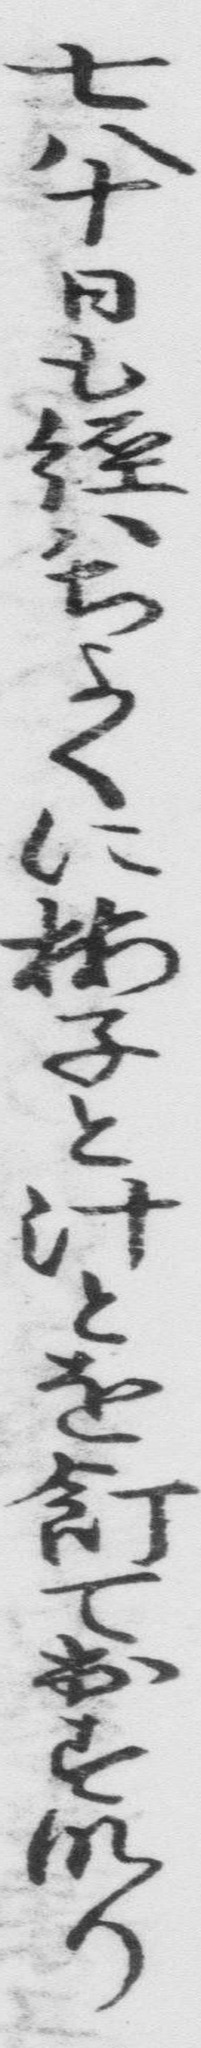七八十日も経はちよくに梅子と汁とを飣て出春那り
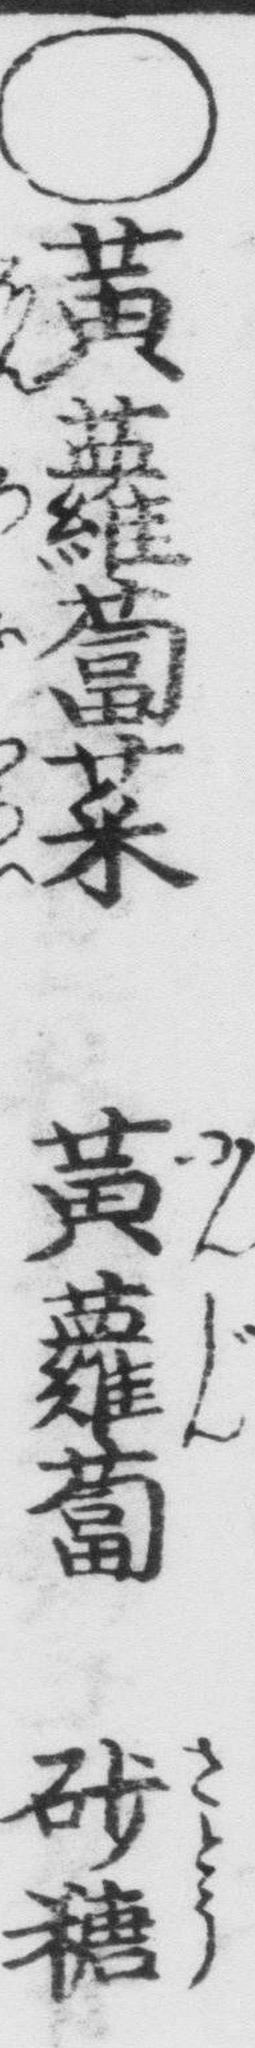〇黄蘿蔔菜黄蘿蔔砂糖
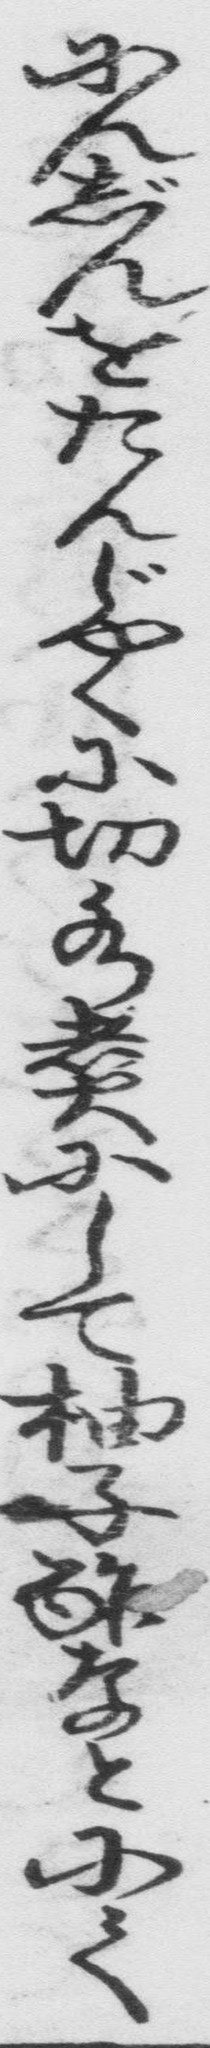尓んじんをたんじやく尓切水煮尓して柚子酢なと尓て
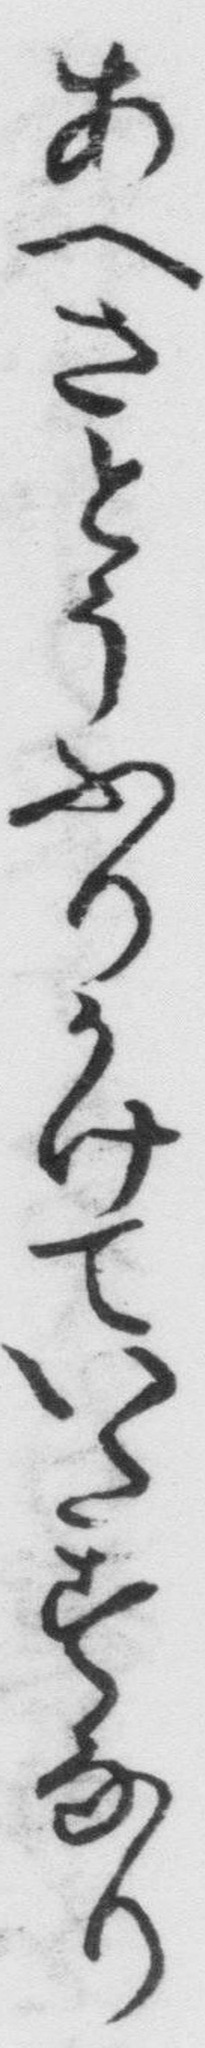あへさとうふりかけていた春なり
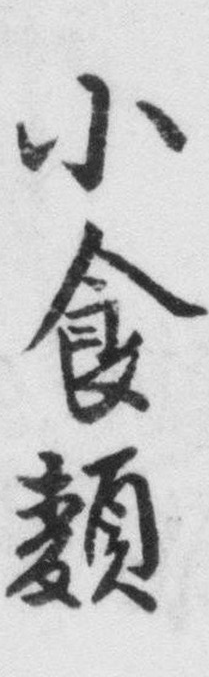小食類

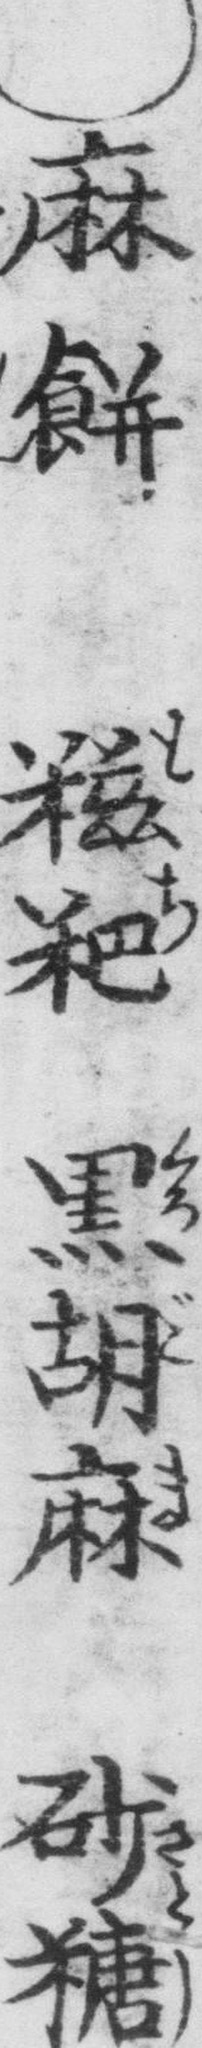〇麻餅糍耙黒胡麻砂糖
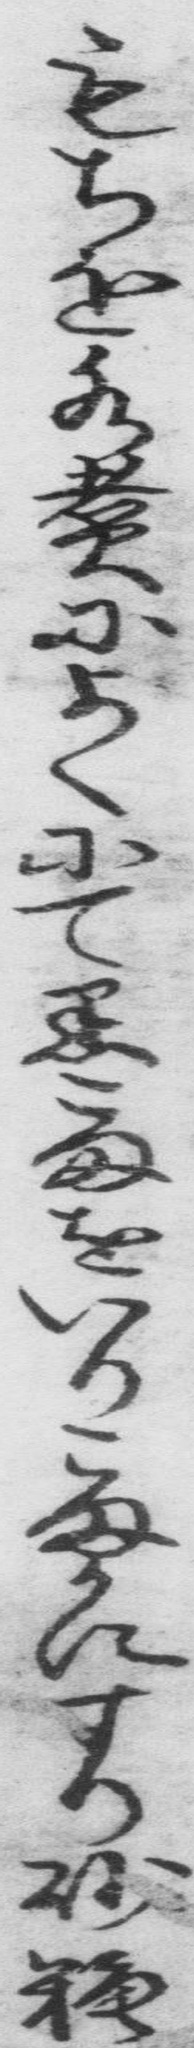もちを水煮尓よく尓て黒こ満をいりこ満かにすり砂糖
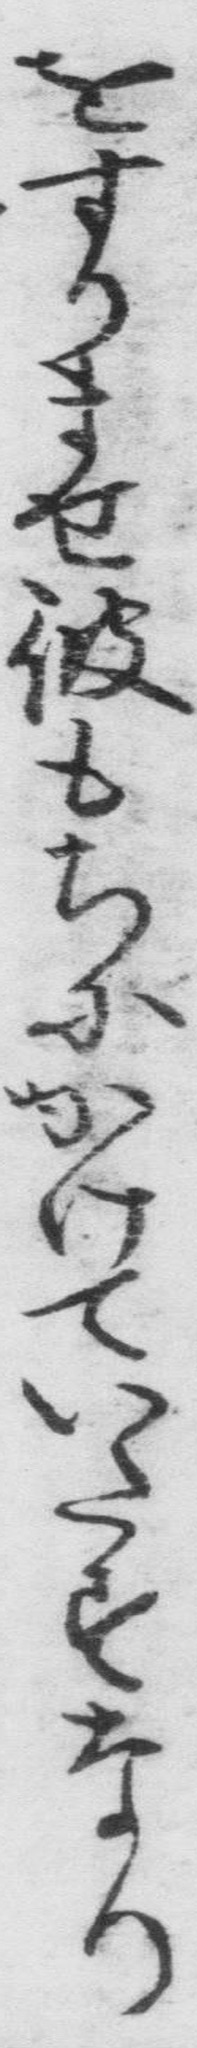をすりませ彼もち尓かけていた春なり
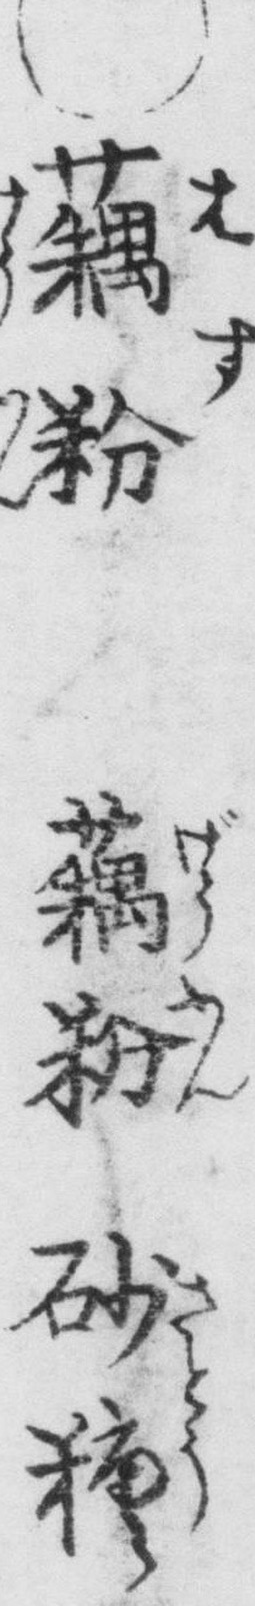〇藕粉藕粉砂糖
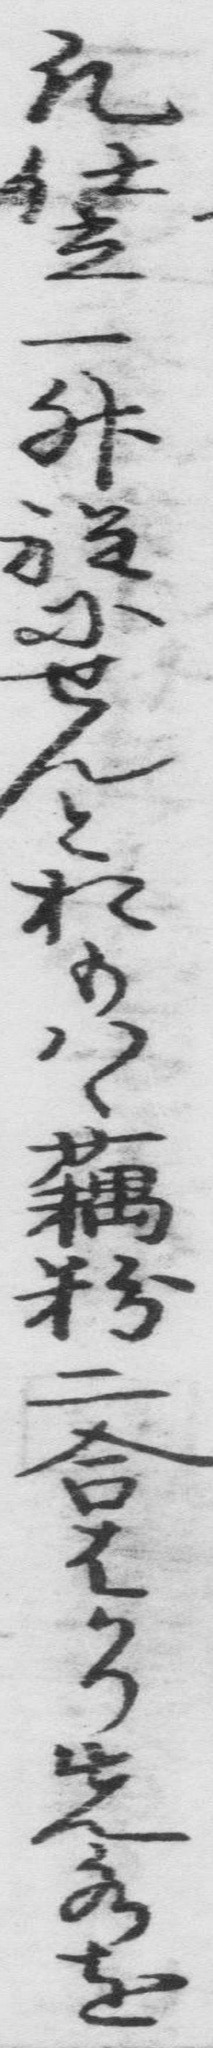凡仕立一升程尓せんと於もはゝ藕粉二合はかり先水を
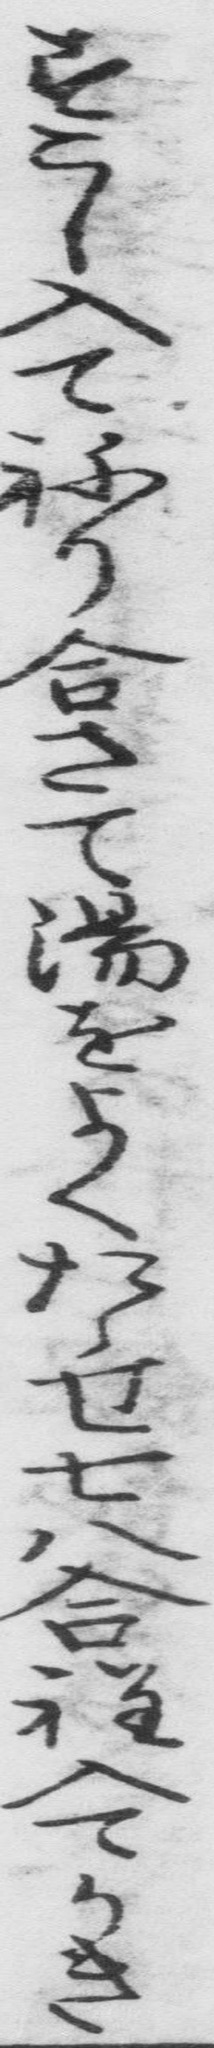春こし入て祢り合さて湯をよくたゝせ七八合程入てかき
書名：普茶料理抄
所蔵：大阪府立大学学術情報センター 国文学研究資料館
